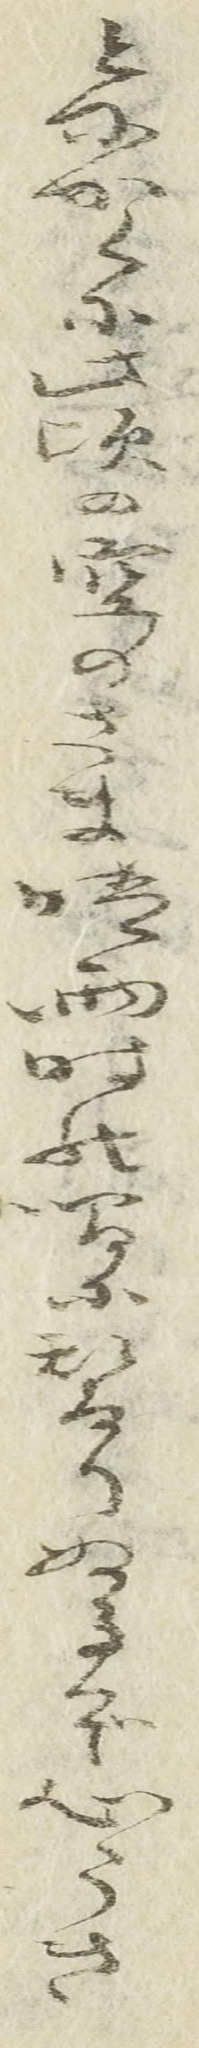とにかくに此頃の空のさま晴雨時の間に替りぬるぞ心うき
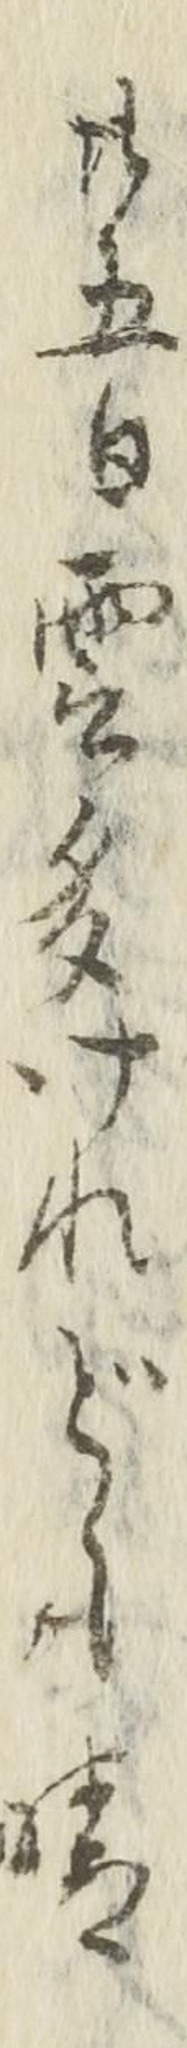廿五日雲多けれども晴
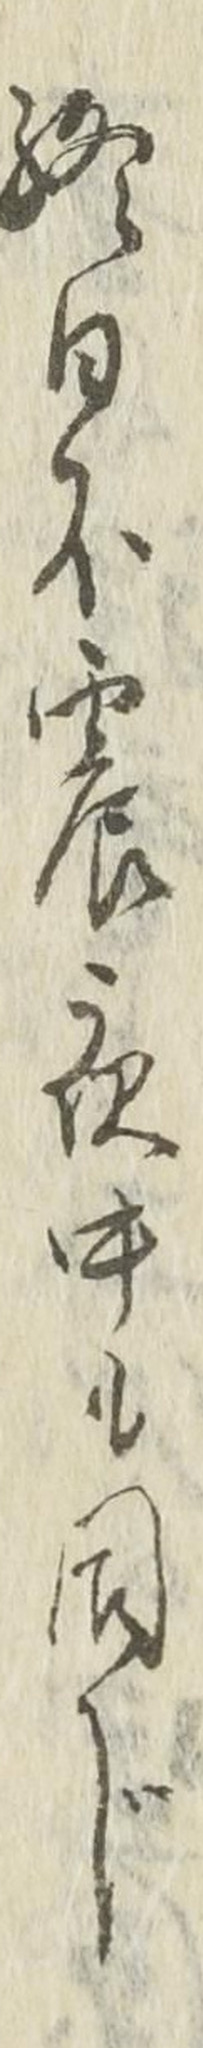終日不震夜中も同じ
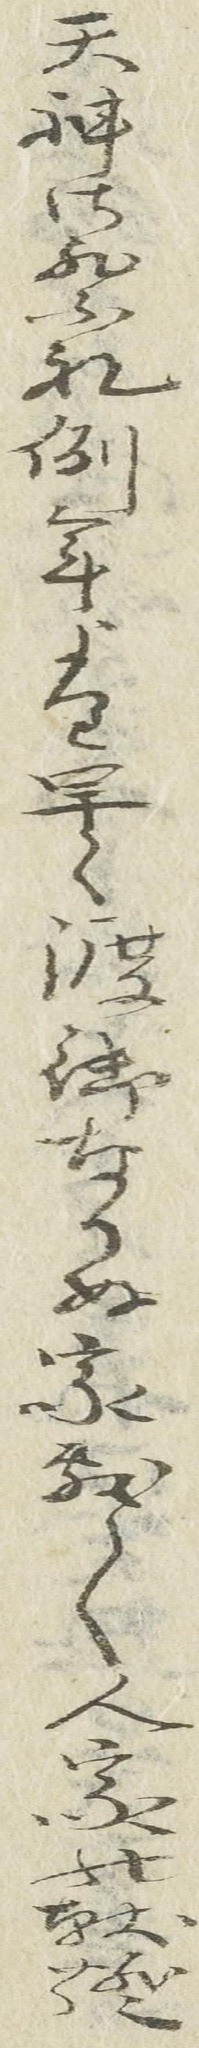天神御祭礼例年より早く渡御なりぬ家敷〳〵人家の献燈
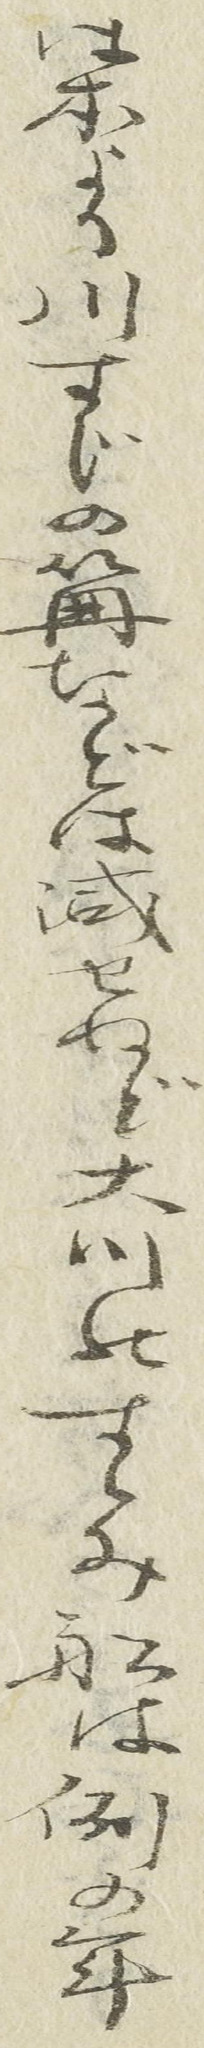は本より川すじの篝などは減せねど大川のすゝみ船は例の年
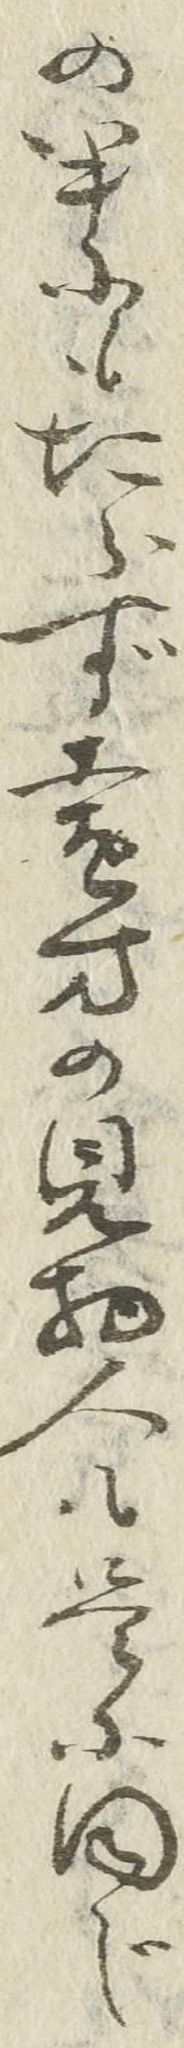の半にもたらず遠方の見物人も是に同じ
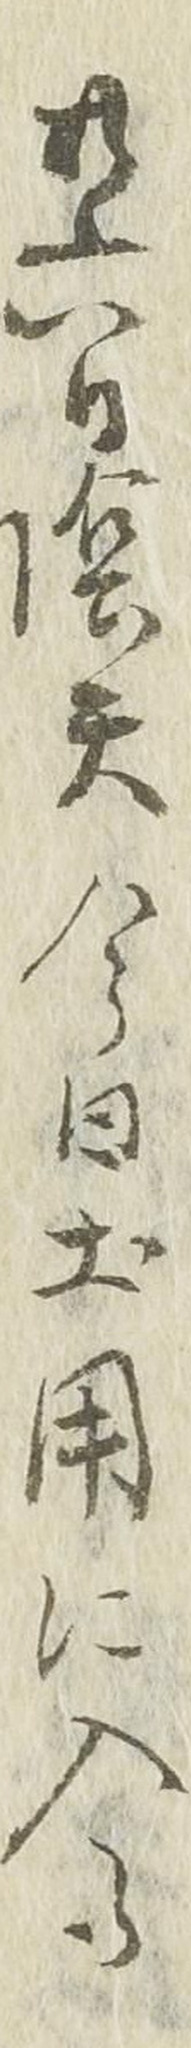廿六日陰天今日土用に入る
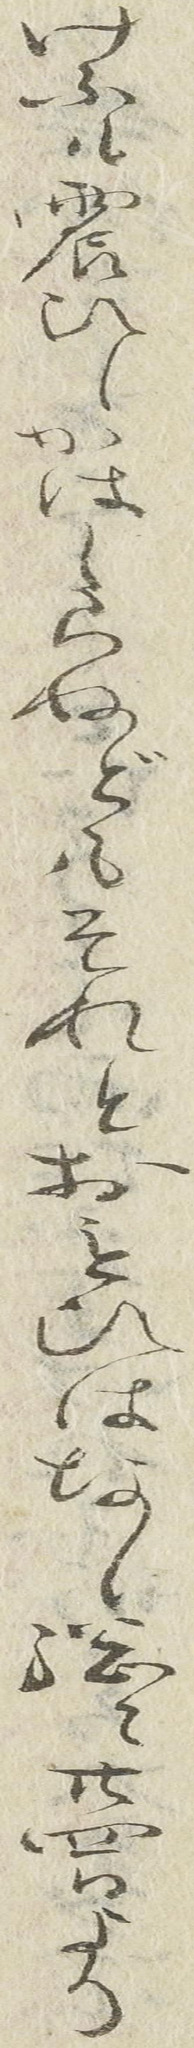けふも震ひしかはしらねどもそれとおもひはなし総て廿四日より
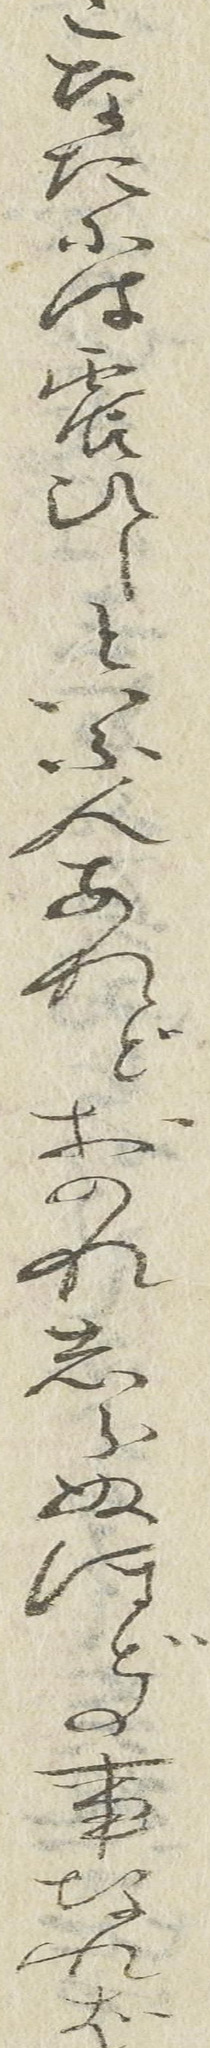こなたには震ひしといふ人あれどおのれしらぬほどの事なれば
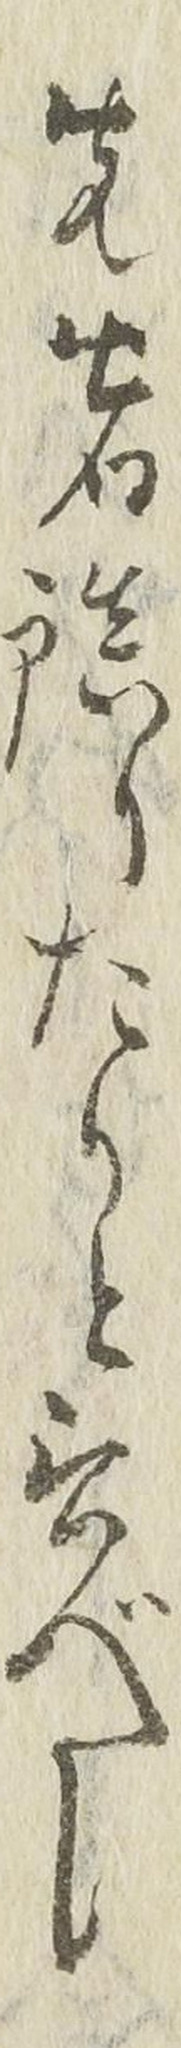先は鎮りたりと云べし
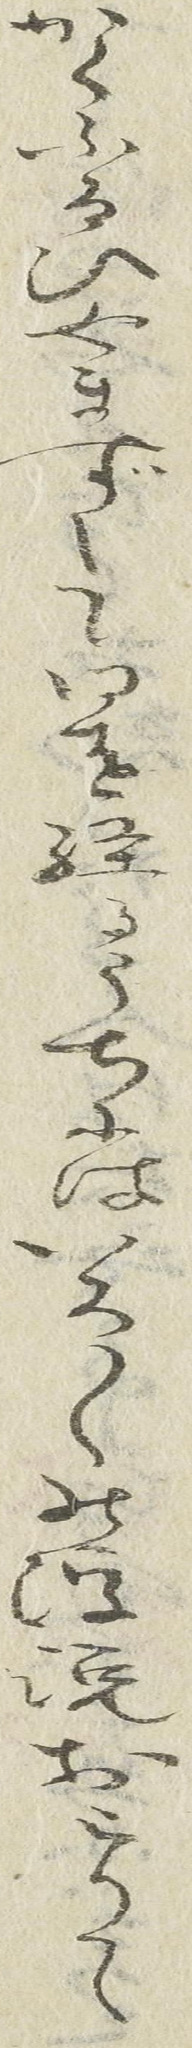かくふるひやまずして日を経るうちにはいろ〳〵の浮説おこりて
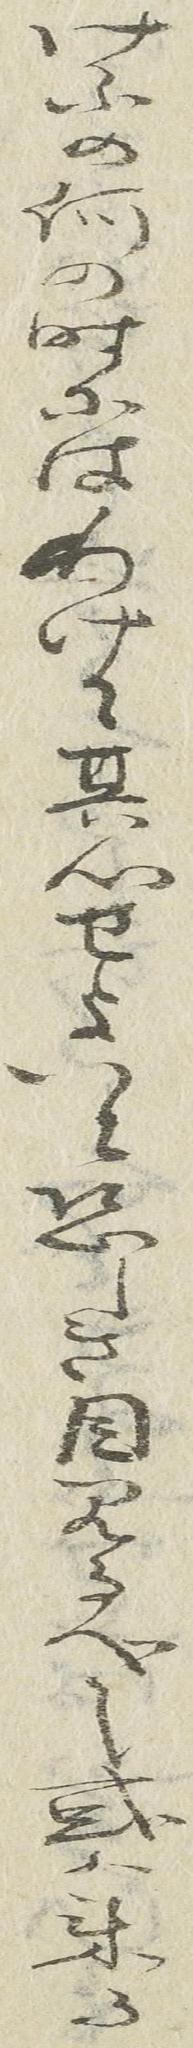けふの何の時にはわけて其心せよいと恐しき目見るべし或ハ来る
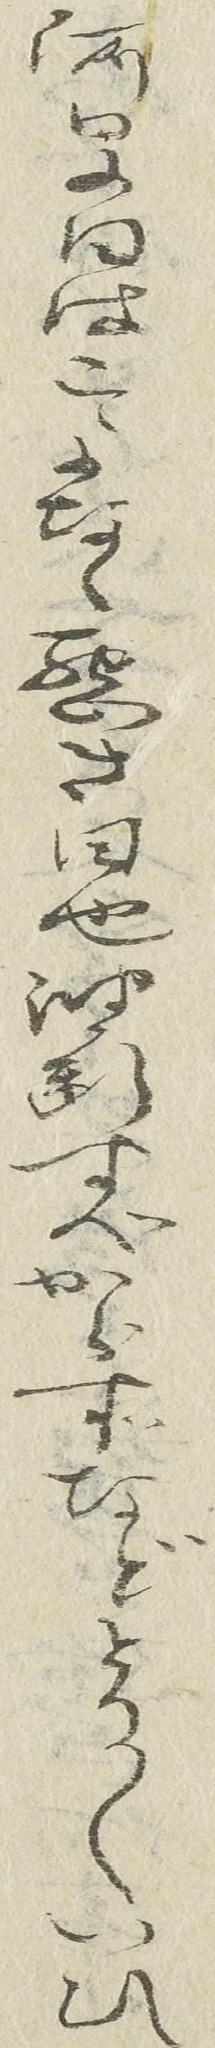何日の日はこよなく悪き日也油断すべからずなどとり〳〵いひ

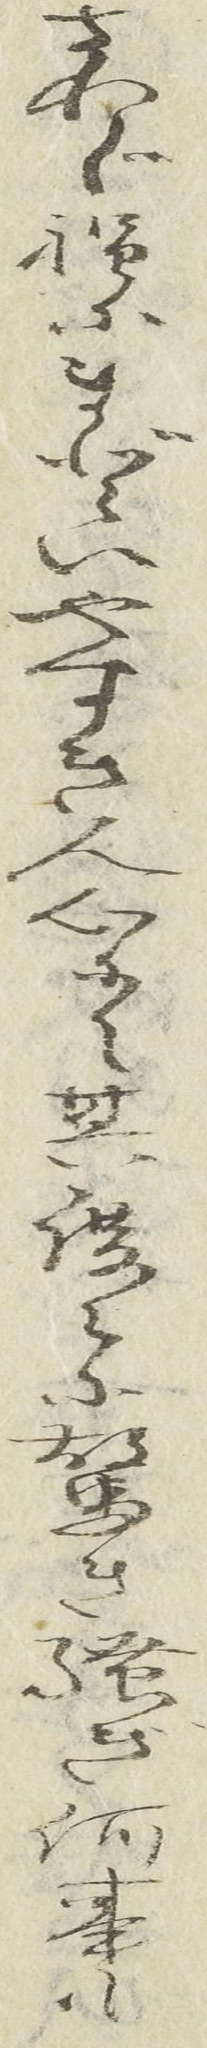さわぐ程にまどいやすき人心にて其度々に驚き騒ぎ何事も
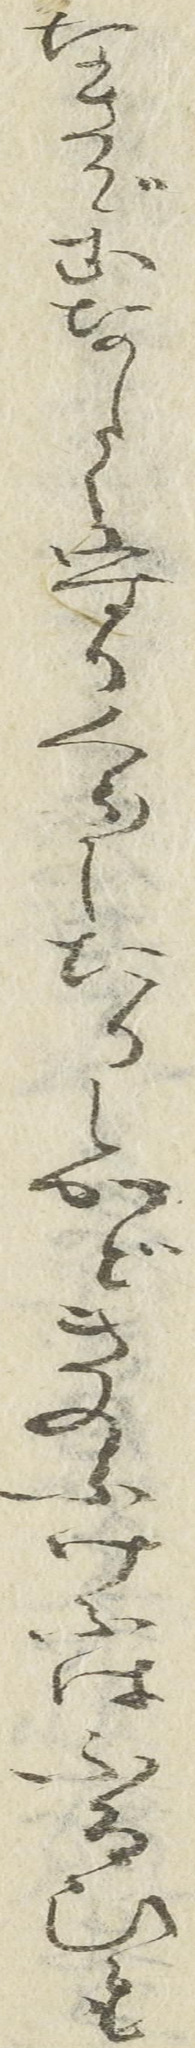なさでこなして守りくらしたりしかどきのふけふはふるひも
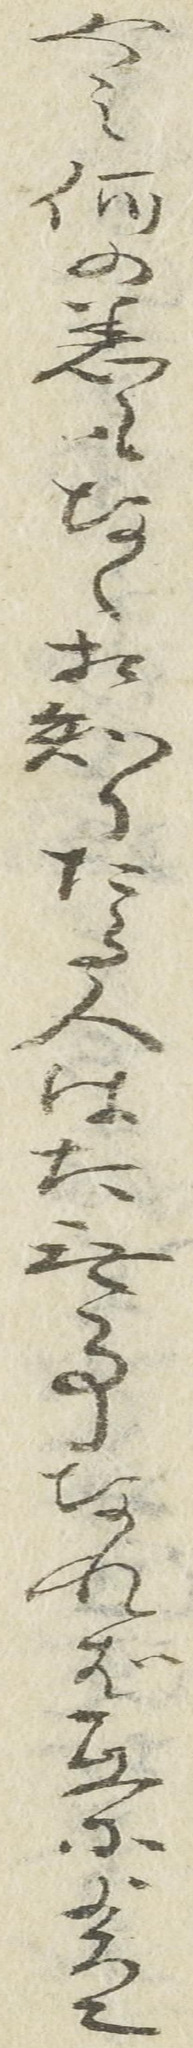やみ何の恙もなく相知りたる人はた無事なれば互によろこ
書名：地震前兆集　全
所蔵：東京大学地震研究所図書室 Earthquake Research Institute Library, The University of Tokyo, JAPAN
